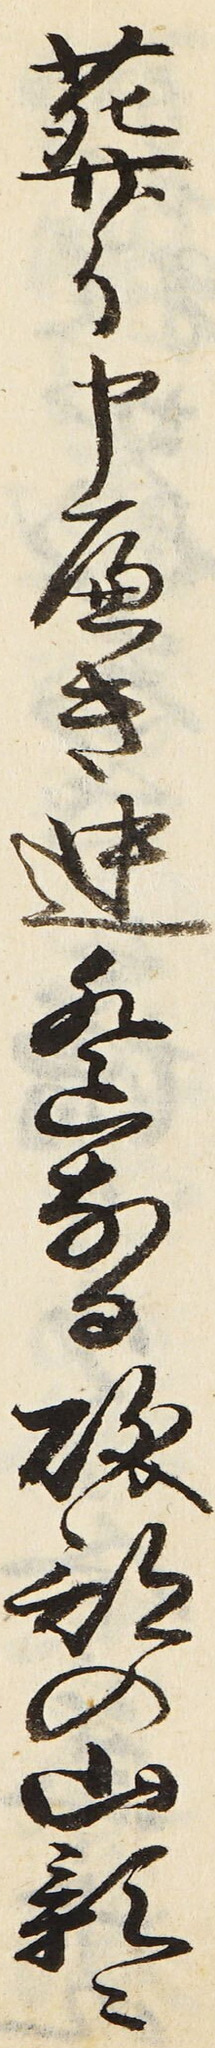葬り申へき迚遥なる磯部の山影に
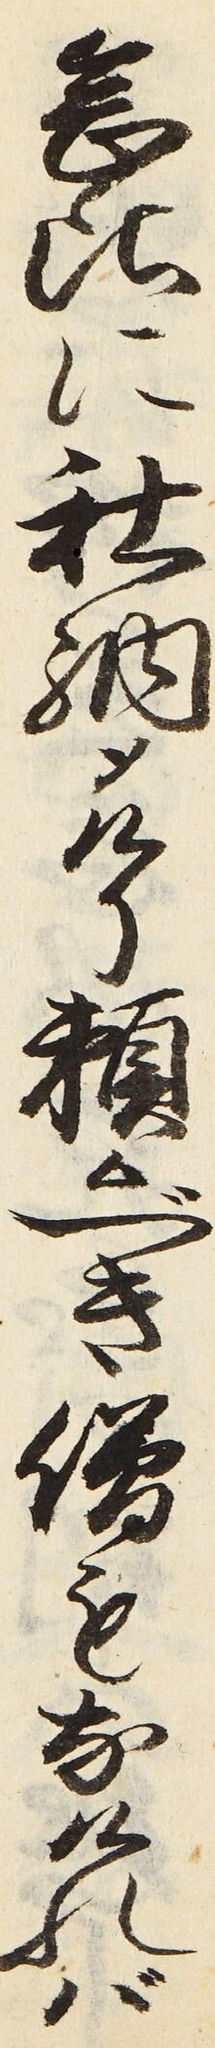念頃に社納メけり頼ムべき僧もなければ
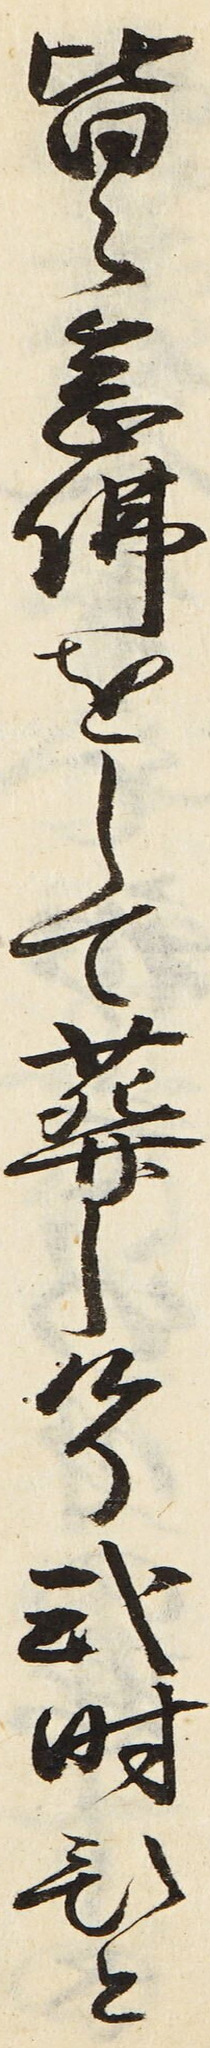皆々念佛をして葬しけり弐時ひと
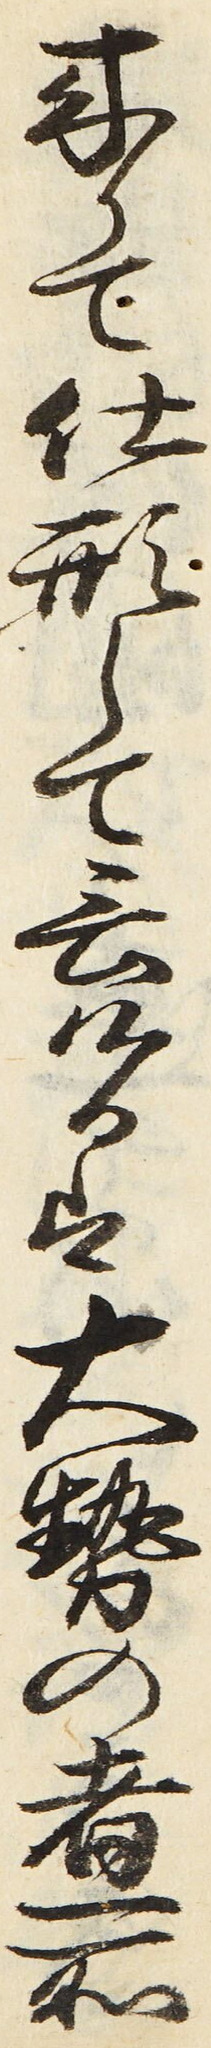来りて仕形して云けるは大勢の者一所
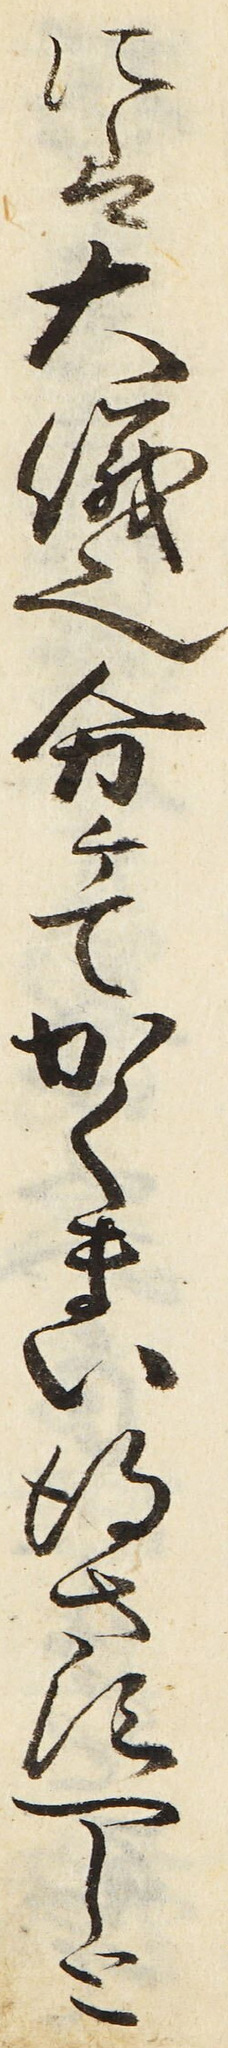には大儀也分ケてかくまい得さすへしと
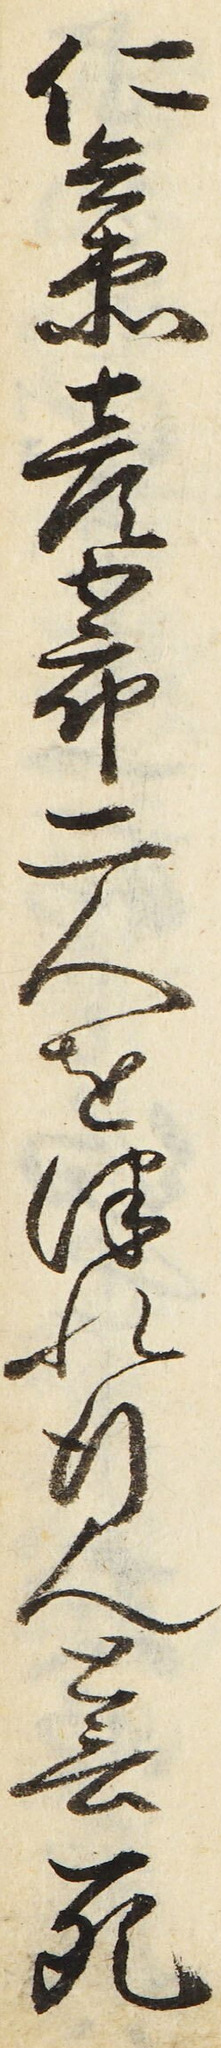仁兵衛彦五郎二人をつれ行んと言死

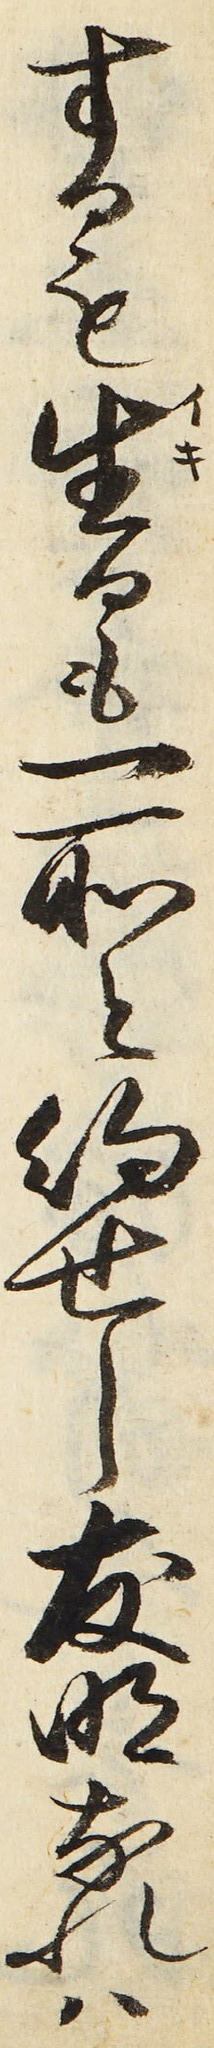するも生るも一所と約せし友朋なれは
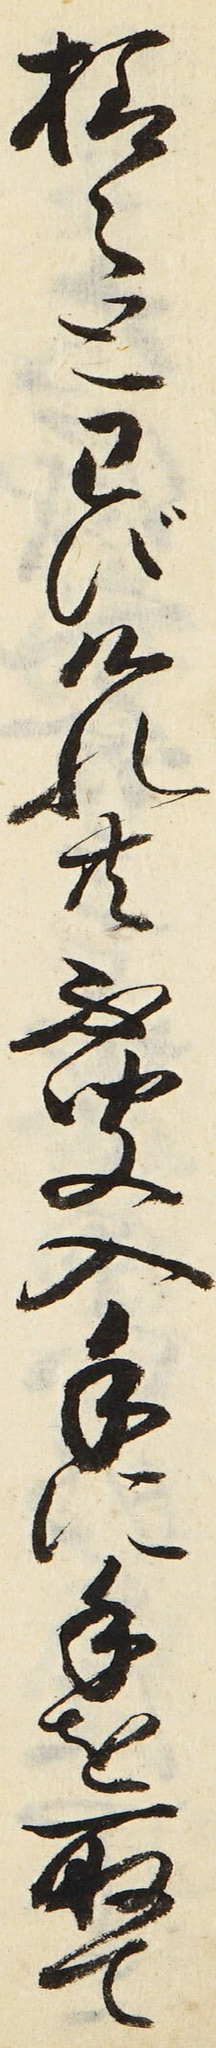様々とわびけれ共不聞入手に手を取て
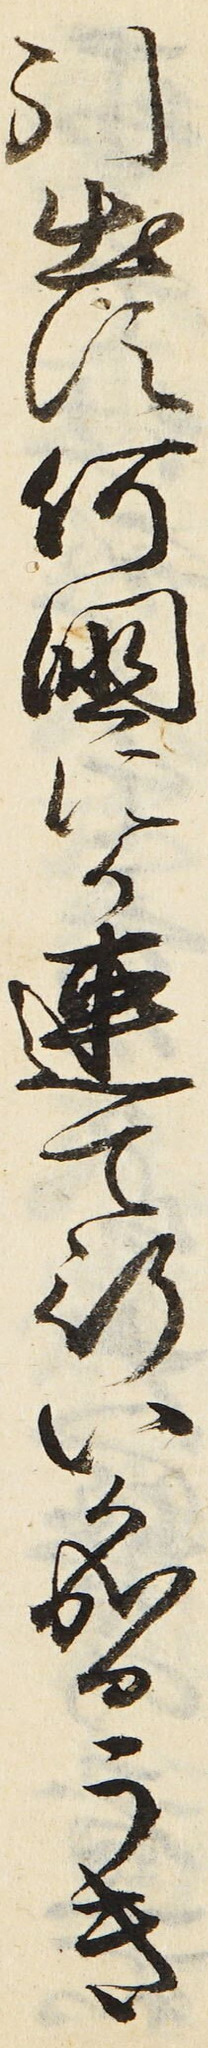引出す何国にか連て行いか成るうき
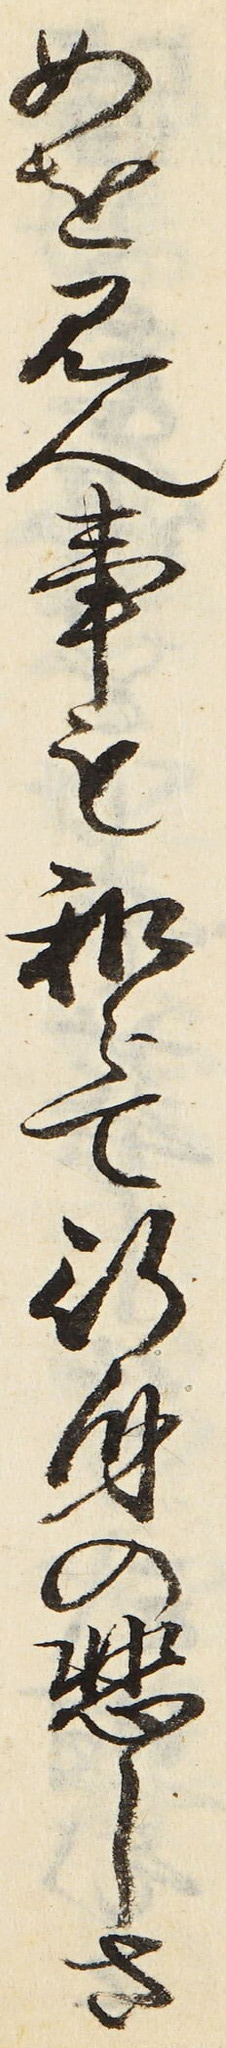めを見ん事も知らて行身の悲しさ
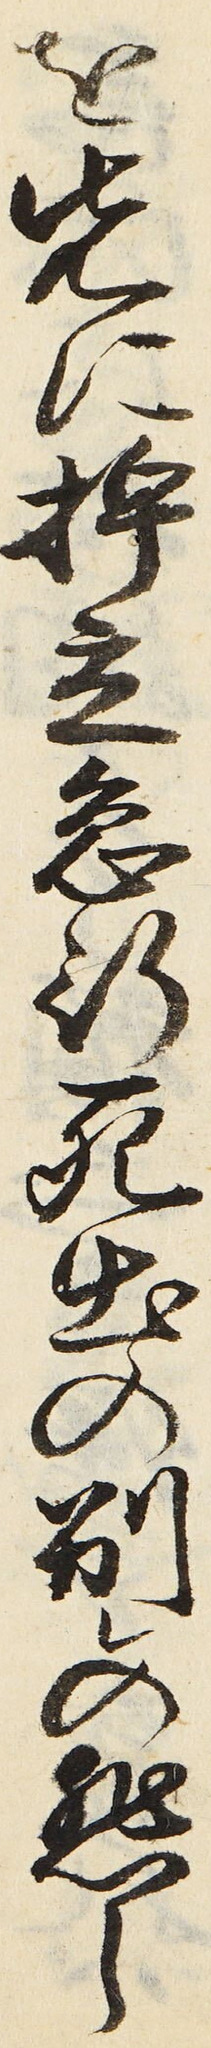を先に押立急行死出の別れの悲し
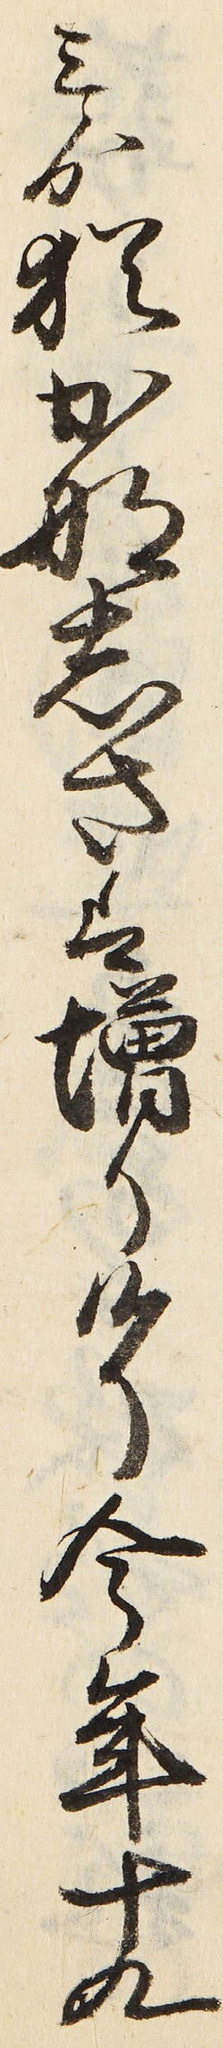みゟ猶かなしさは増りけり今年十九
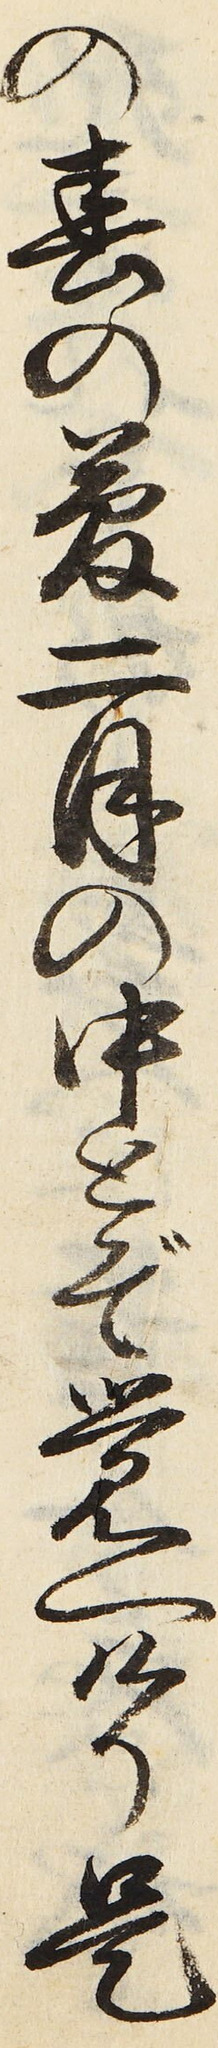の春の夢二月の中とぞ覚へけり是
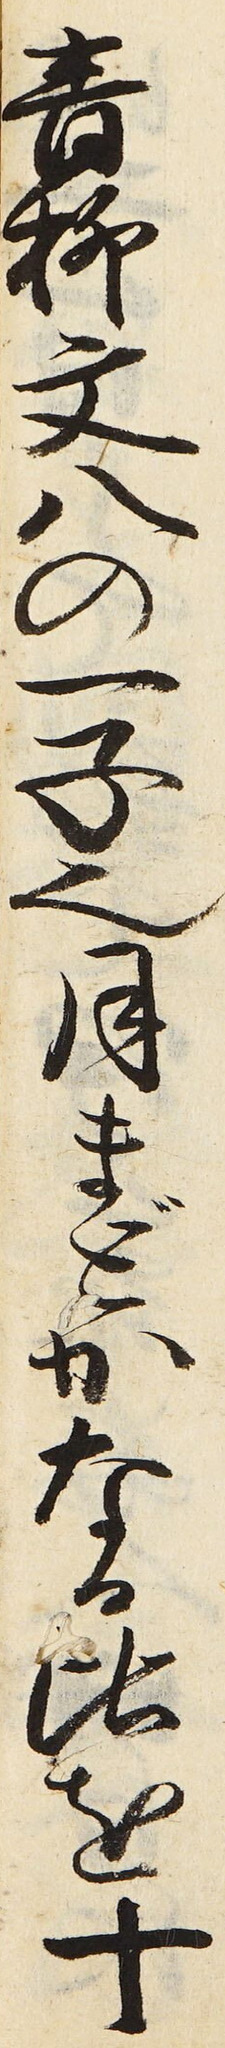青柳文八の一子也月まどかなる頃を十
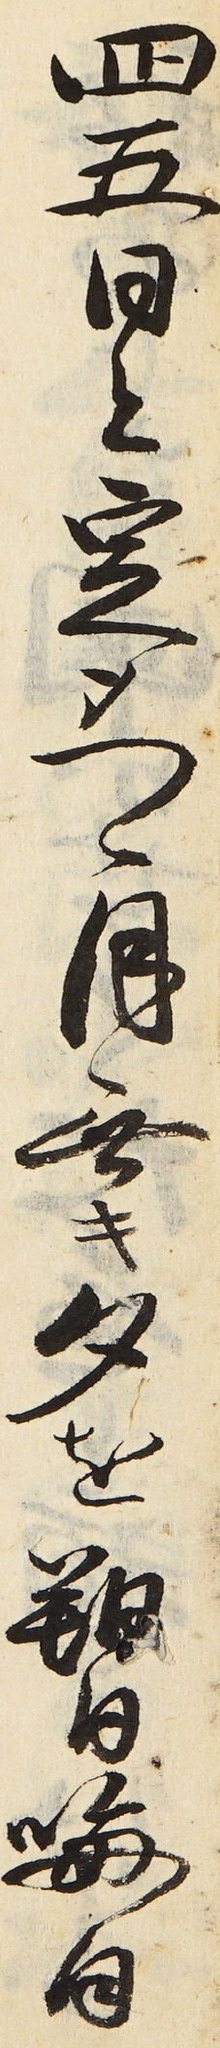四五日と定めつゝ月無き夕を朔日晦日
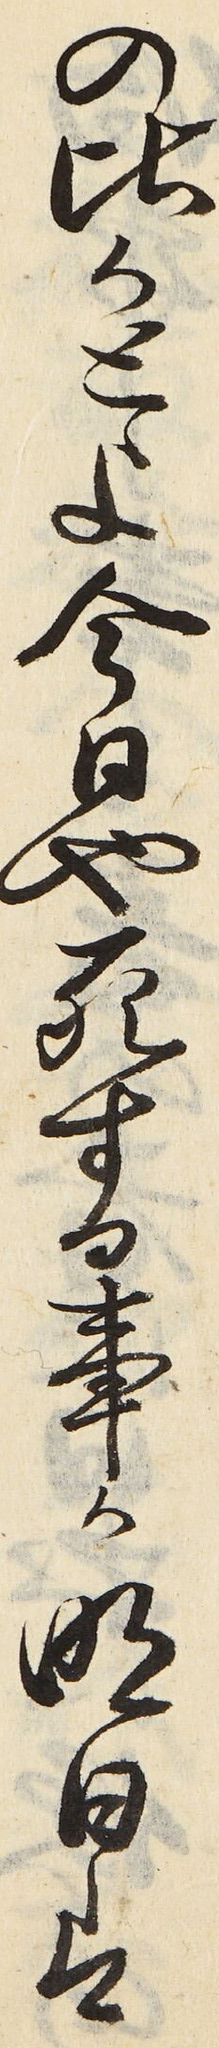の頃かとよ今日や死する事か明日は
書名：華夷九年録
